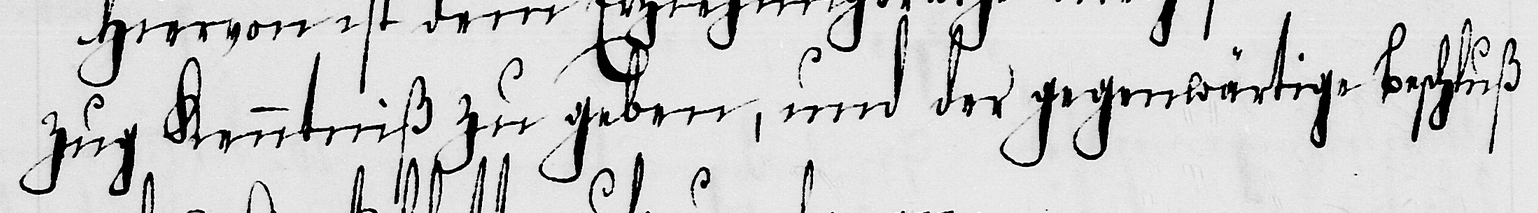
szug Kenntniß zu geben, und der gegenwärtige Beschluß
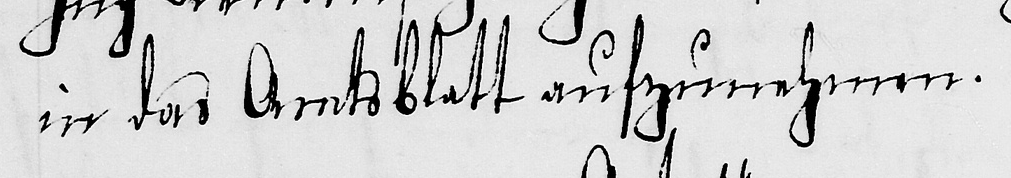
in das Amtsblatt aufzunehmen.
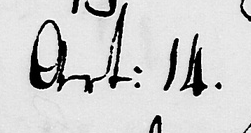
Art: 14.
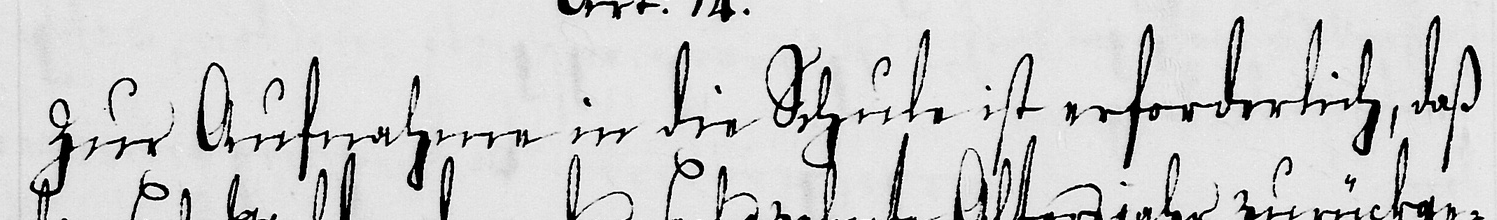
Zur Aufnahme in die Schule ist erforderlich, daß
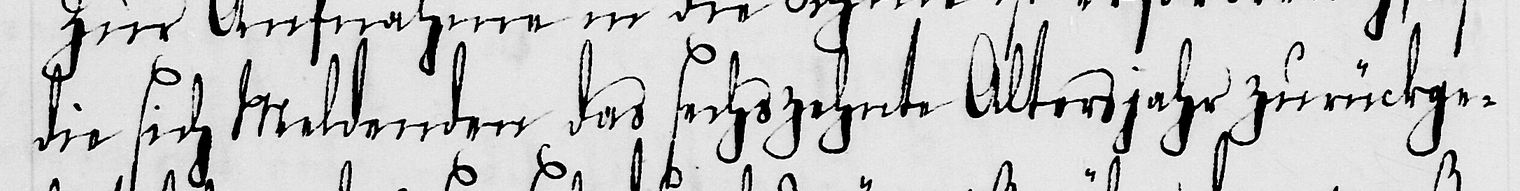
die sich Meldenden das sechszehnte Altersjahr zurückgel¬
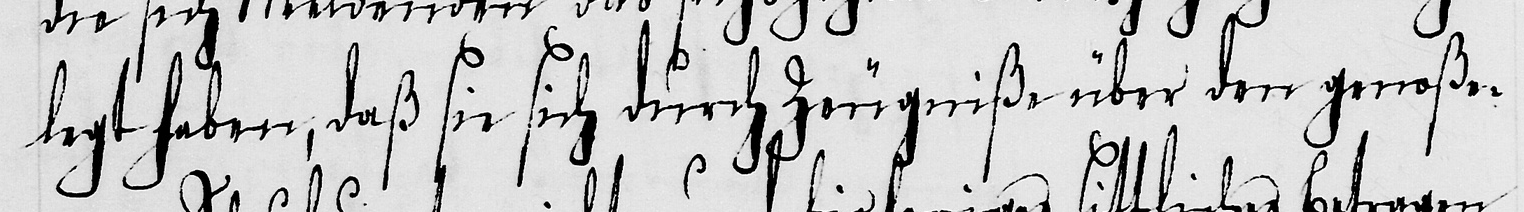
egt haben, daß sie sich durch Zeugniße über den genoße¬
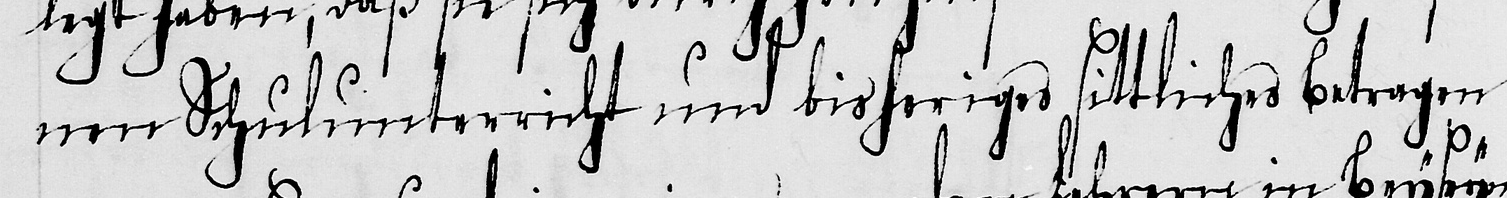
nen Schulunterricht und bisheriges sittliches Betragen
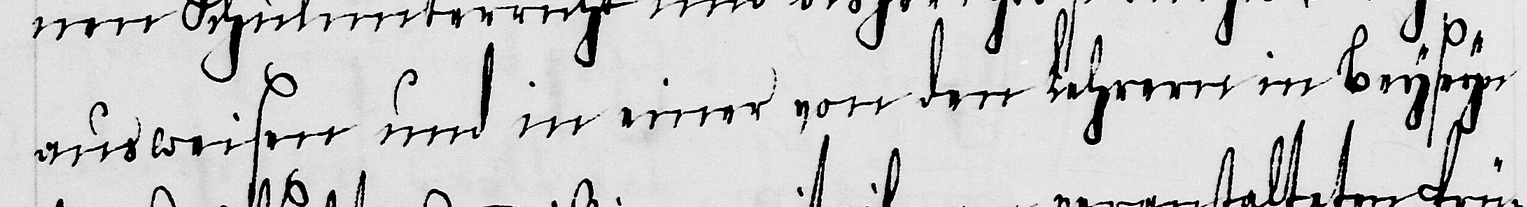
ausweisen und in einer von den Lehrern in Beyseyn
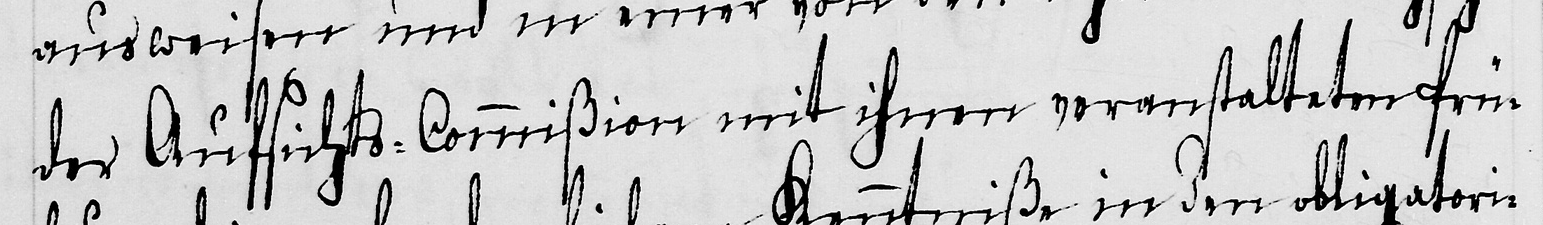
der Aufsichts-Commißion mit ihnen veranstalteten Prü¬
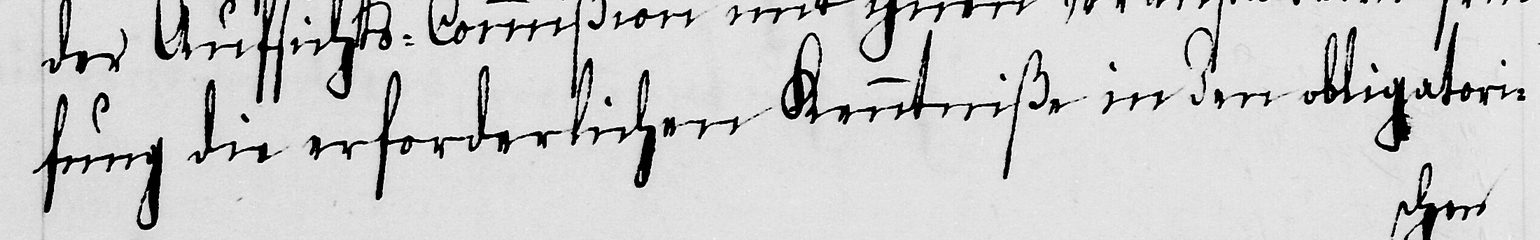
fung die erforderlichen Kenntniße in den obligatori-
